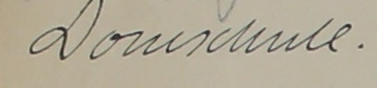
Domschule
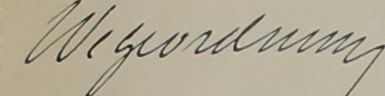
Wegeordnung
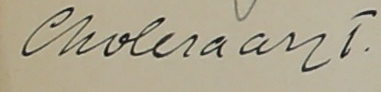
Choleraarzt
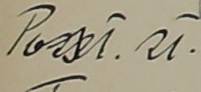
Post st
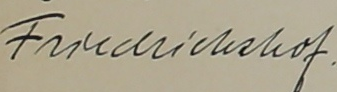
Friedrichshof
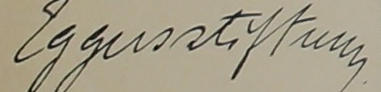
Eggersstiftung
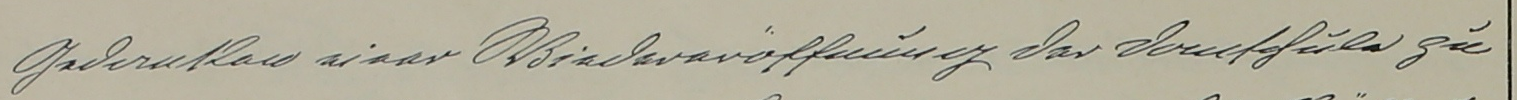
Gedanken einer Wiedereröffnung der Domschule zu
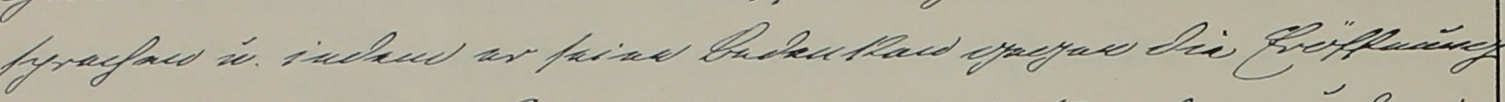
sprechen u. indem er seine Bedenken gegen die Eröffnung
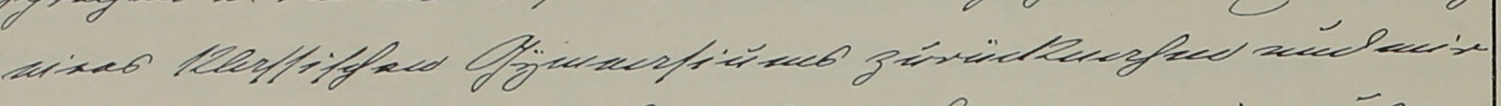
eines klassischen Gymnasiums zurücknahm und mir
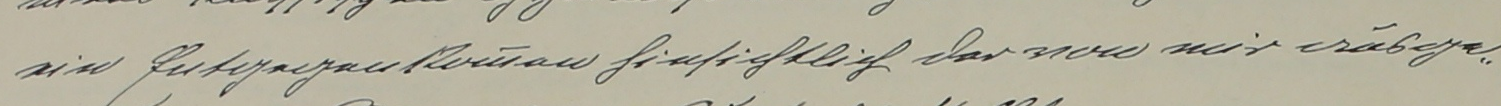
ein Entgegenkommen hinsichtlich der von mir ausge-
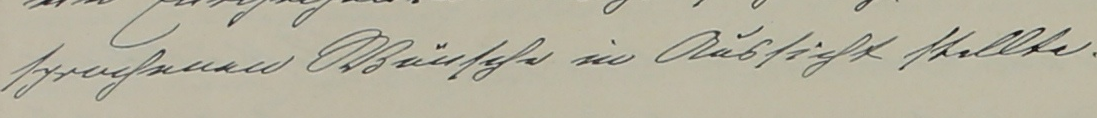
sprochenen Wünsche in Aussicht stellte.
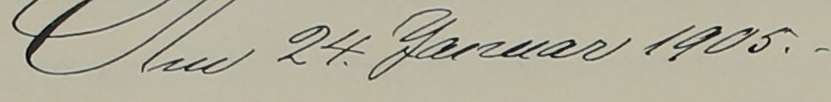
Am 24. Januar 1905.
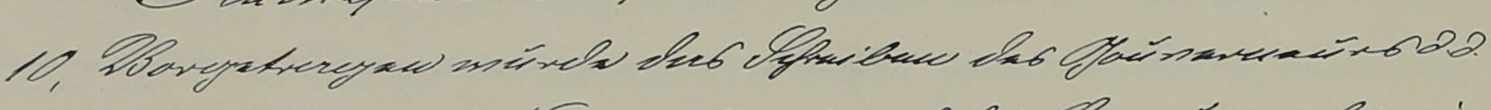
10. Vorgetragen wurde das Schreiben des Gouverneurs d.d.
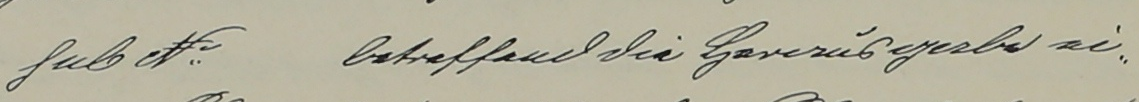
sub No. betreffend die Herausgabe ei-
